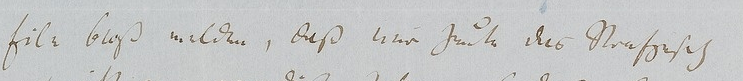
Eile bloß melden, daß wir heute das Strafgesetz
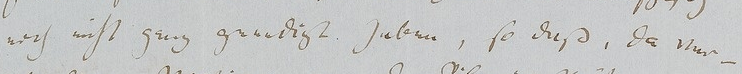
noch nicht ganz geendigt haben, so daß, da ver-
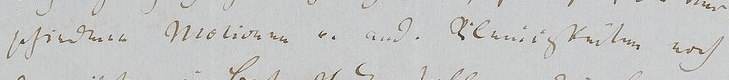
schiedene Motionen & and. Kleinigkeiten noch
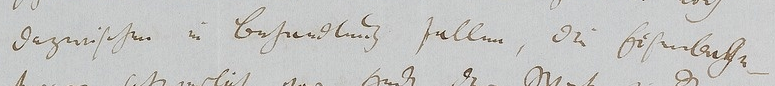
dazwischen in Behandlung fallen, die Eisenbahn-
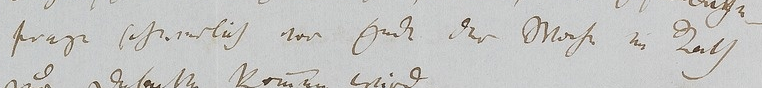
frage schwerlich vor Ende der Woche im Rath
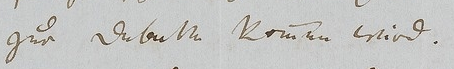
zur Debatte kommen wird.
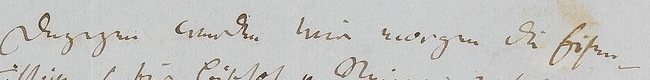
Dagegen werden wir morgen die Eisen-
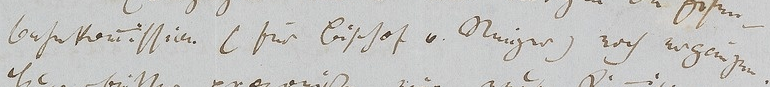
bahnkommission (für Bischof &. Steiger) noch ergänzen.
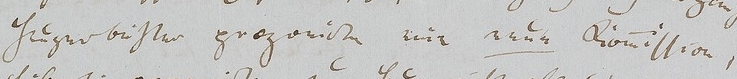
Hungerbühler proponirte eine neue Kommission,
